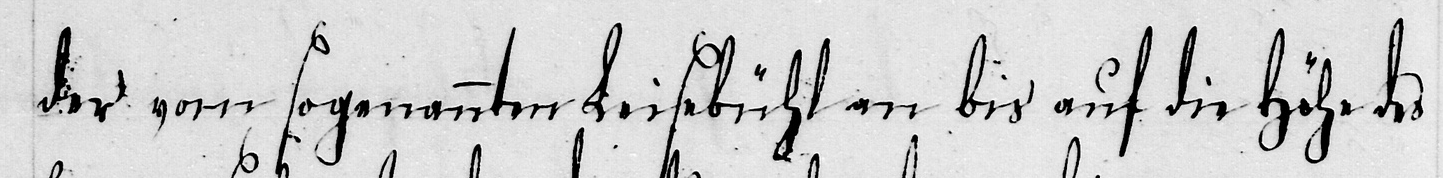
der vom sogenannten Leisebühl an bis auf die Höhe des
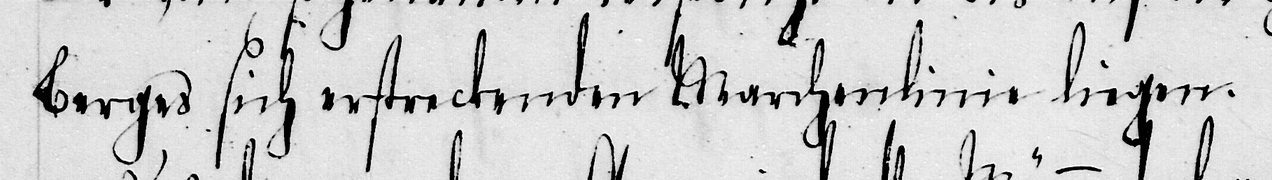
Berges sich erstreckenden Marchenlinie liegen.
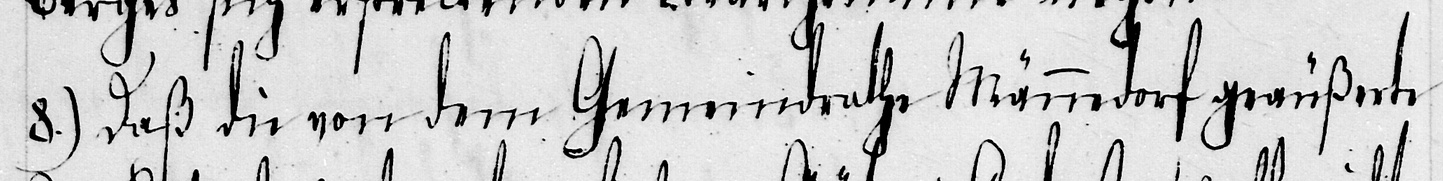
8.) Daß die von dem Gemeindrathe Männedorf geäußerte
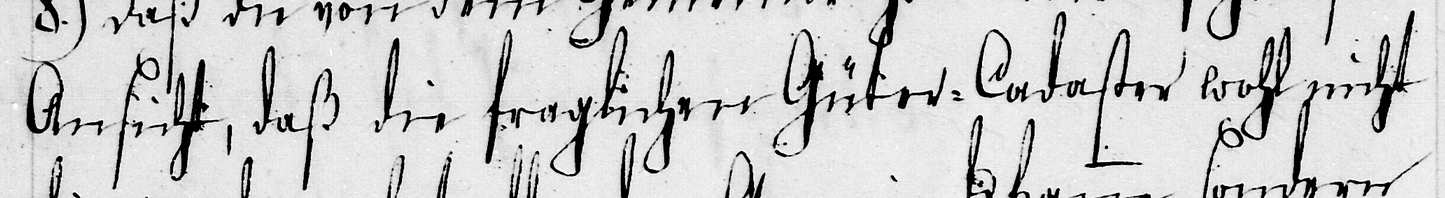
Ansicht, daß die fraglichen Güter-Cadaster wohl nicht
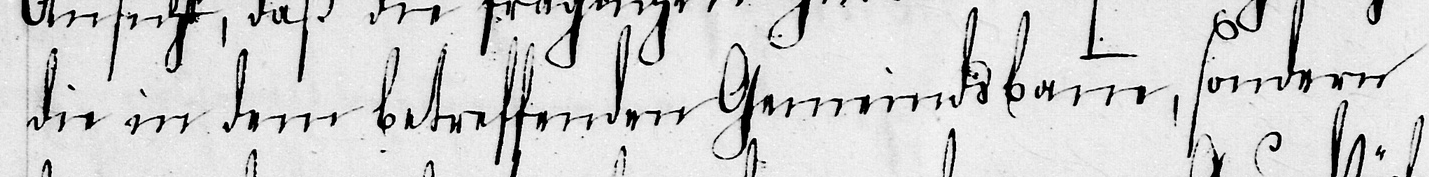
die in dem betreffenden Gemeindsbanne, sondern
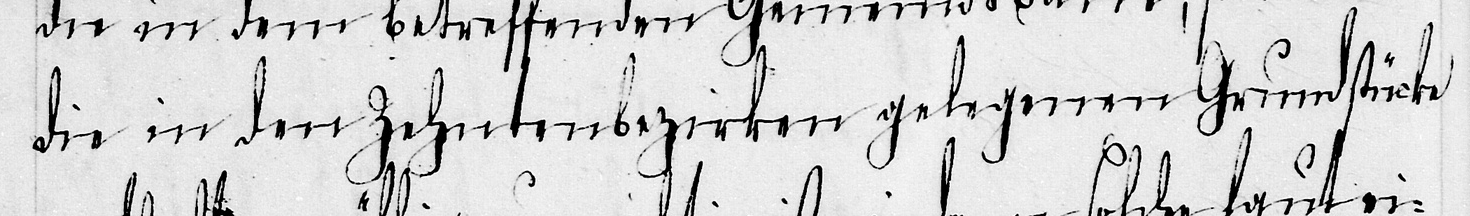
die in den Zehntenbezirken gelegenen Grundstücke
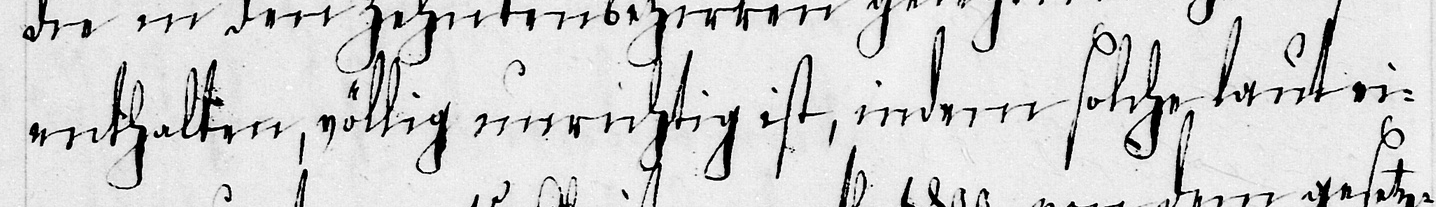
enthalten, völlig unrichtig ist, indem solche laut ei¬
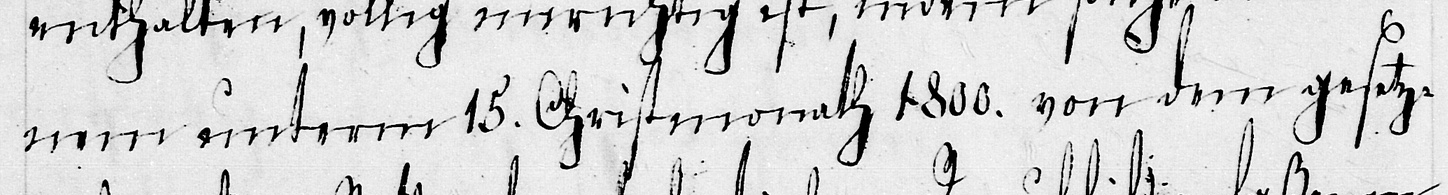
nem unterm 15. Christmonath 1800. von dem gesetz¬
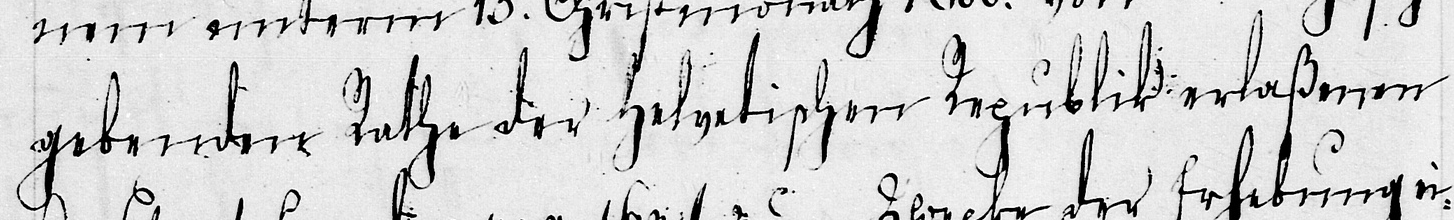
gebenden Rathe der helvetischen Republik erlaßenen
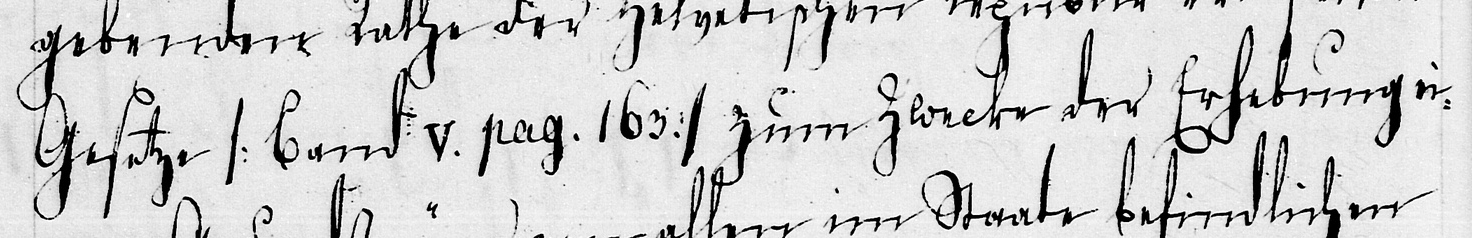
Gesetze [Band V. pag. 163] zum Zwecke der Erhebung ei¬
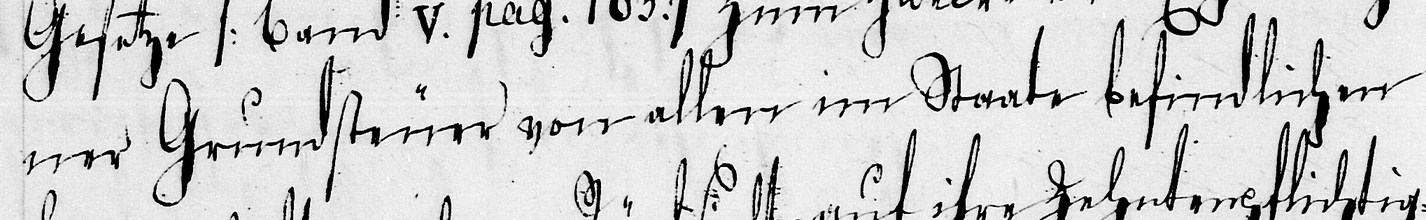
ner Grundsteuer von allen im Staate befindlichen
